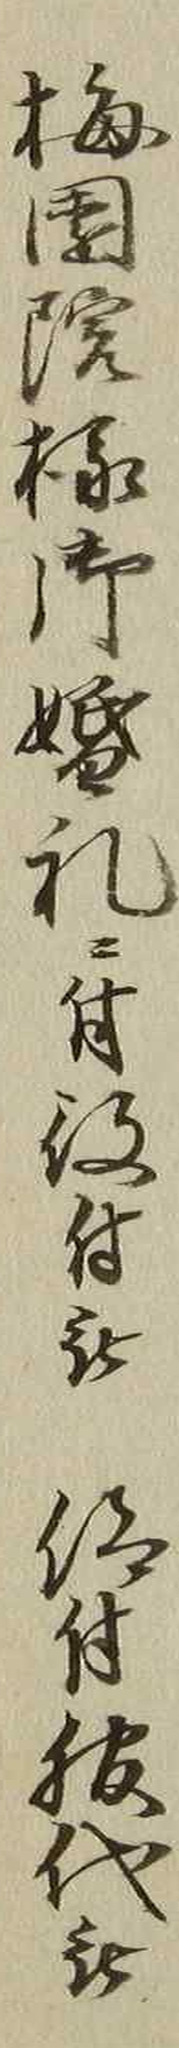梅園院様御婚礼ニ付役付被仰付服代被
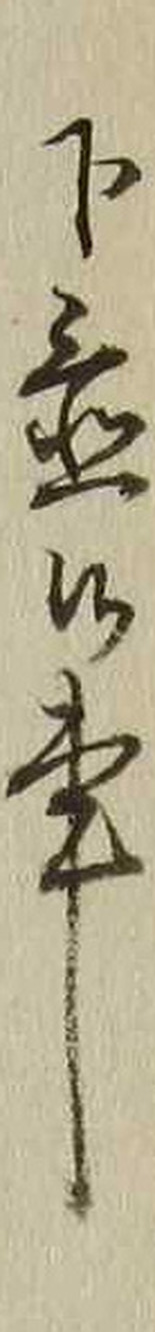下置候事
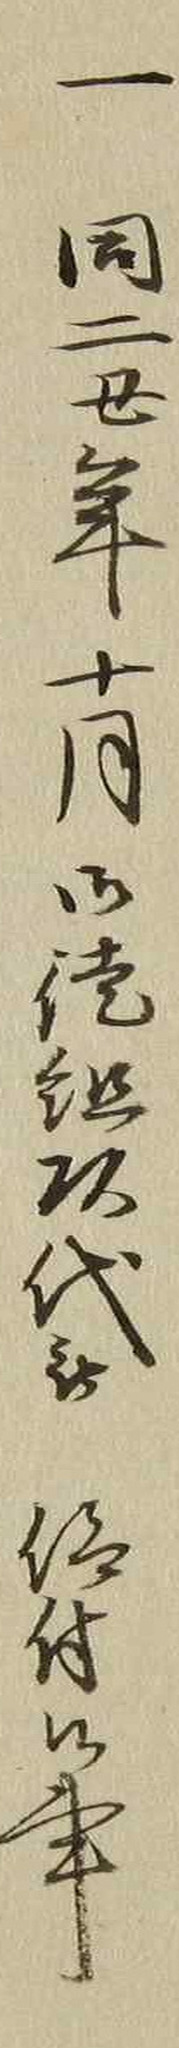一同ニ丑年十月御徒組頂代被仰付候事
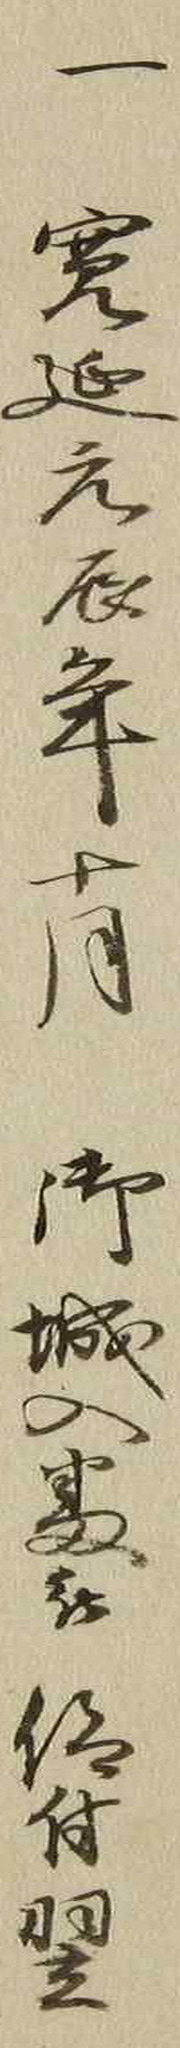一寛延元辰年十月御城入番被仰付翌
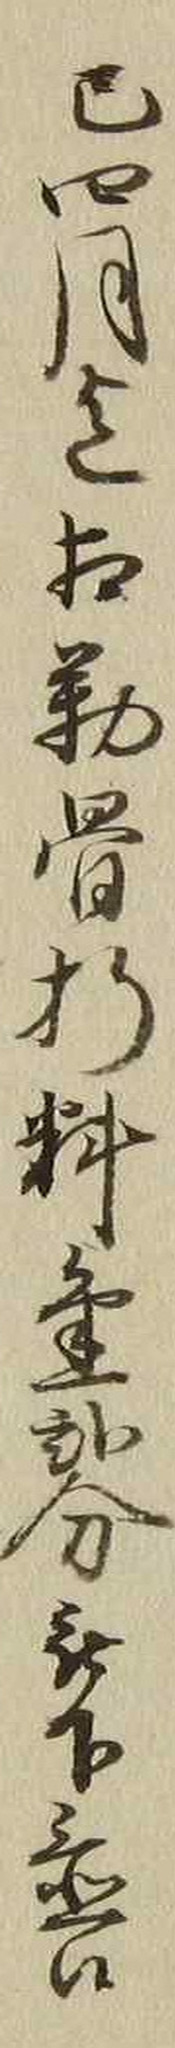巳四月迄相勤骨折料金弐分被下置候
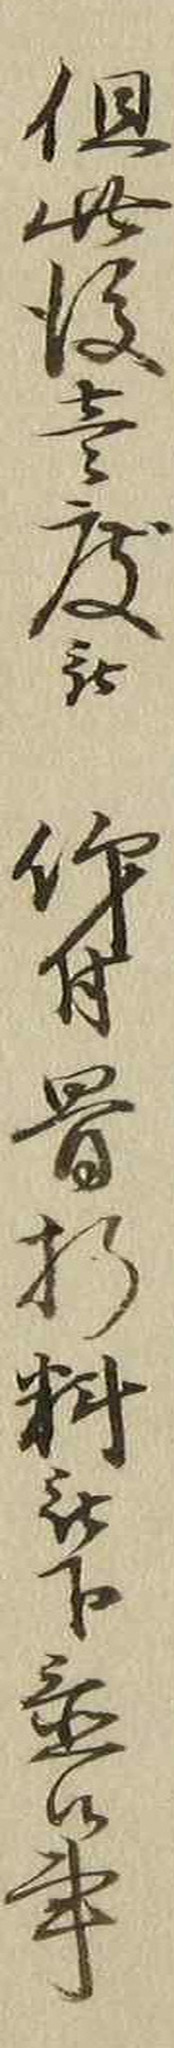但此後壱度被仰付骨折料被下置候事
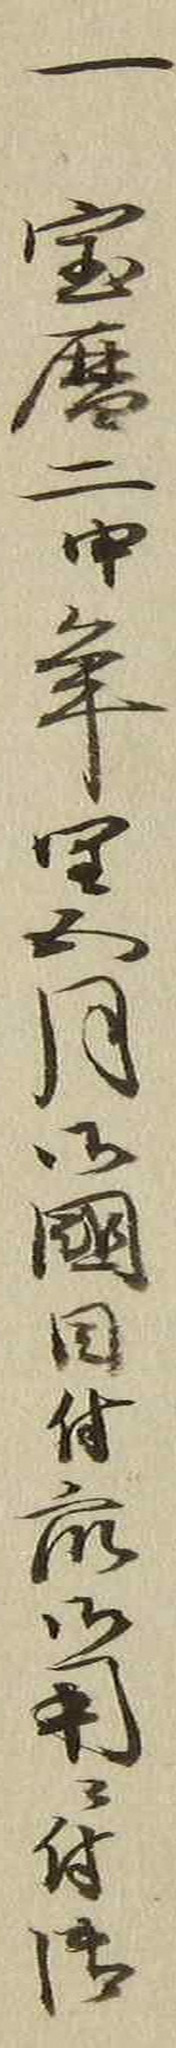一宝暦ニ申年閏五月御国目付衆御用ニ付御
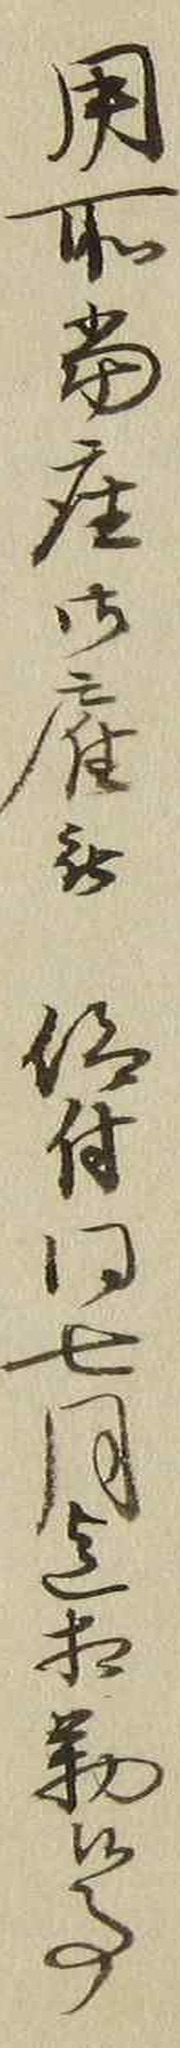用所当座御雇被仰付同七月迄相勤候事
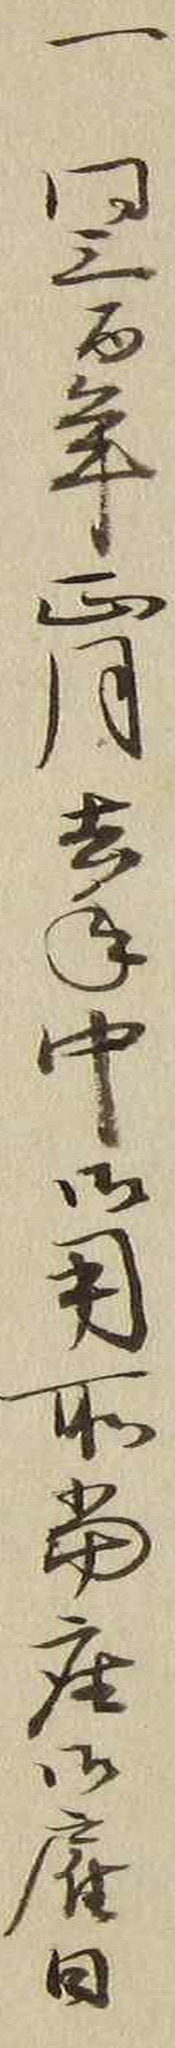一同三酉年正月去年中御用所当座御雇日
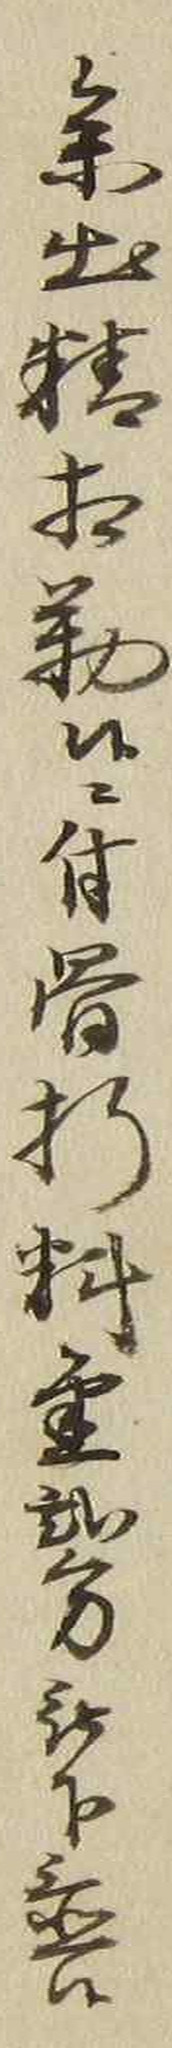参出精相勤候ニ付骨折料金弐方被下置候
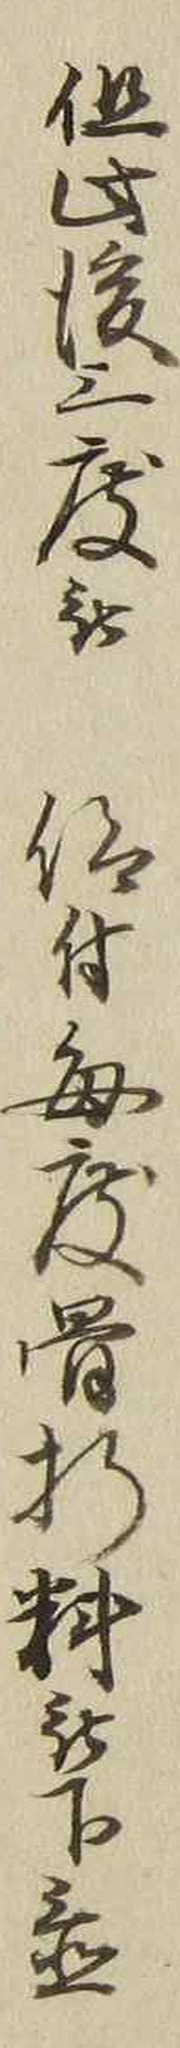但此後三度被仰付毎度骨折料被下置

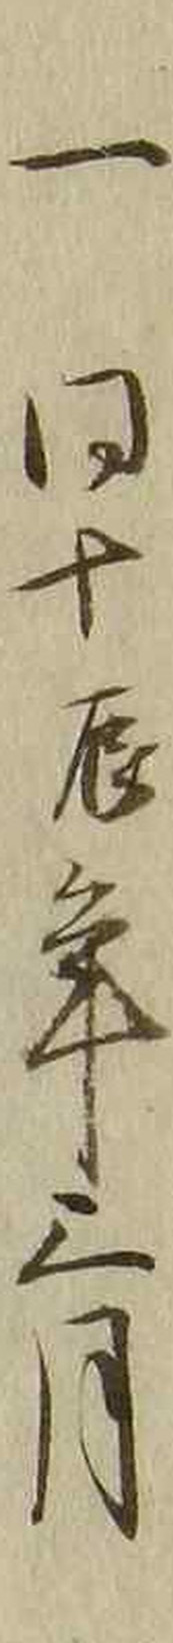一同十辰年三月
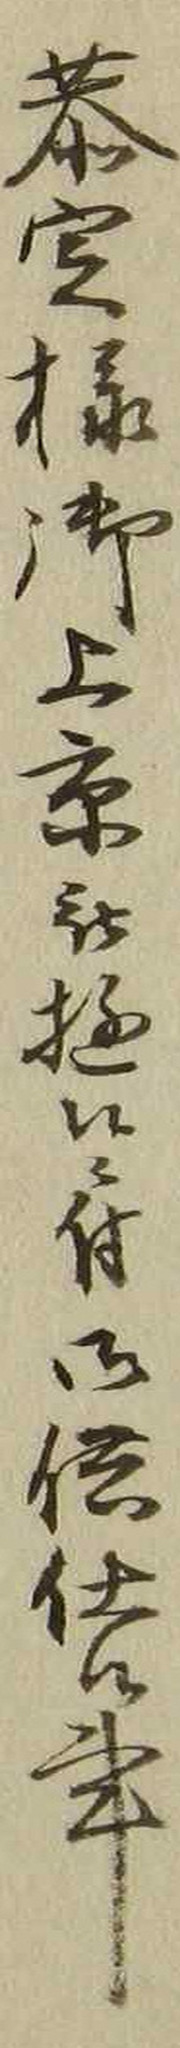恭定様御上京被遊候ニ付御供仕候事
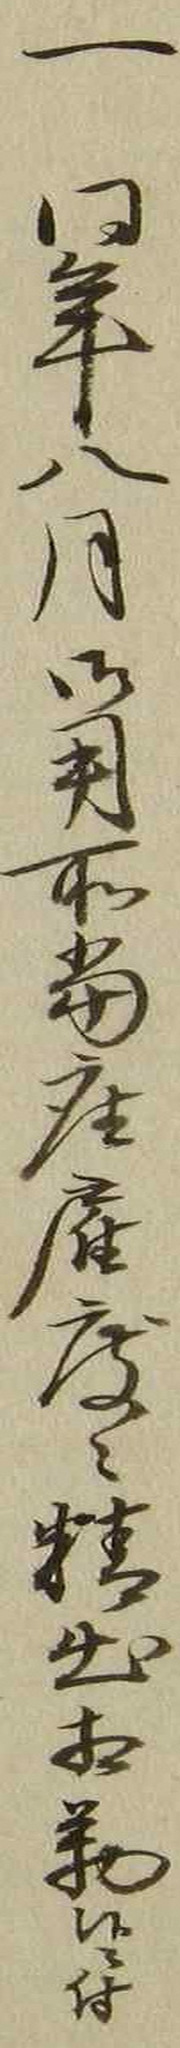一同年八月御用所当座雇度々精出相勤候ニ付
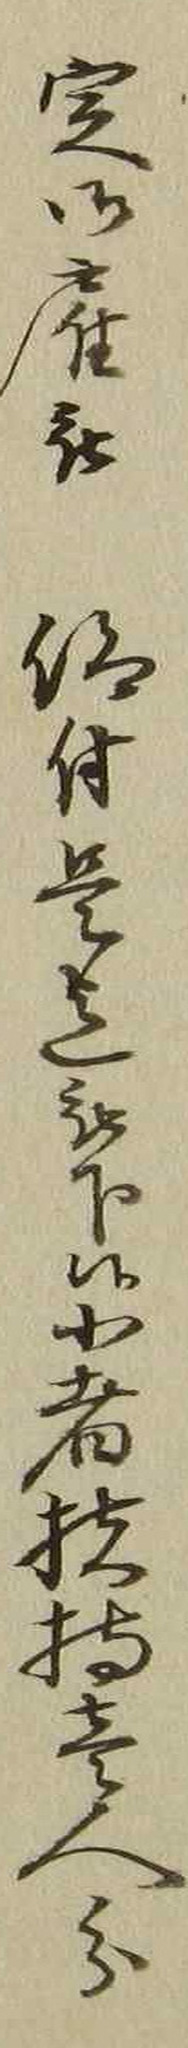定御雇被仰付是迄被下候小者扶持壱人分
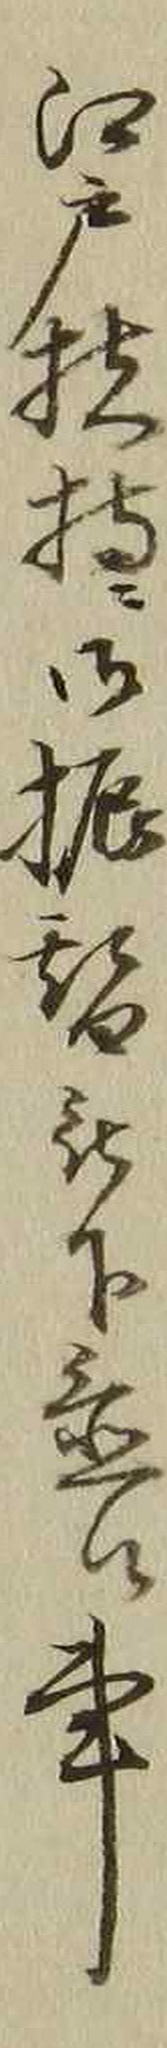江戸扶持ニ御振替被下置候事
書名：諸士系譜　巻之114　か之部22
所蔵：会津若松市立会津図書館
